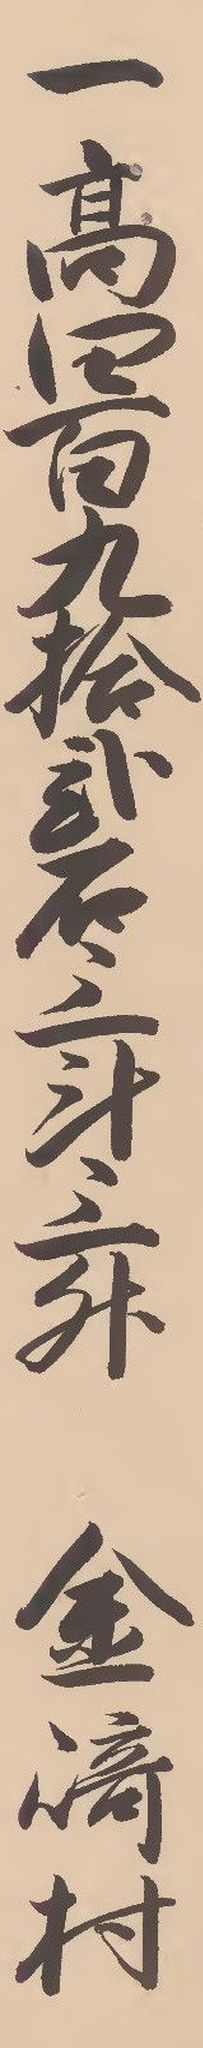一高四百九拾弐石三斗三升金崎村
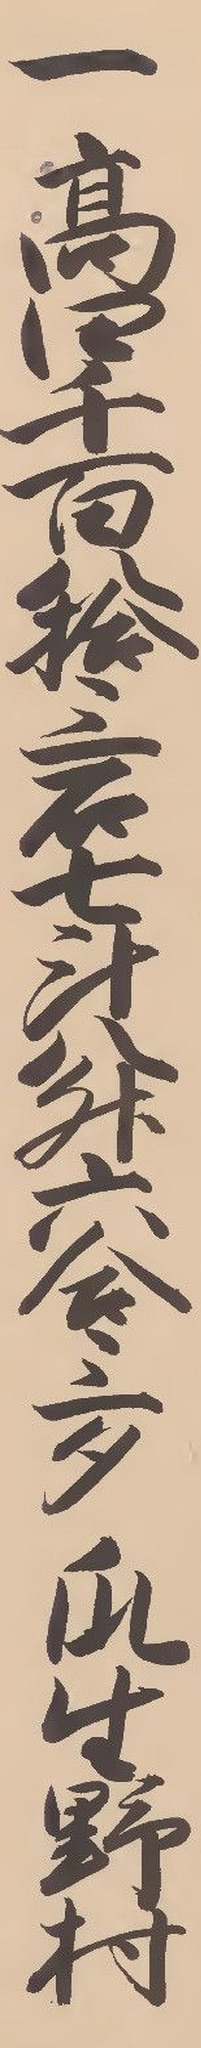一高四千百八拾三石七斗八升六合三勺瓜生野村
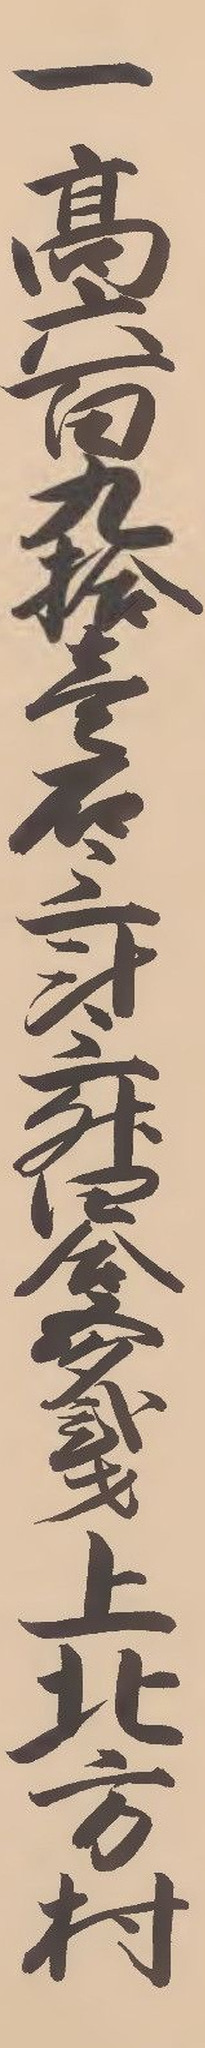一高六百九拾壱石三斗三升四合五勺弐才上北方村
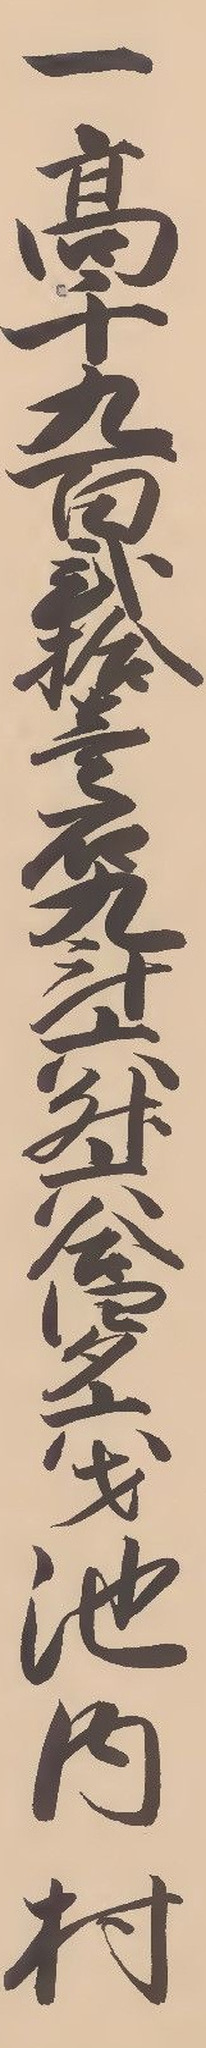一高千九百弐拾壱石九斗六升六合四勺六才池内村
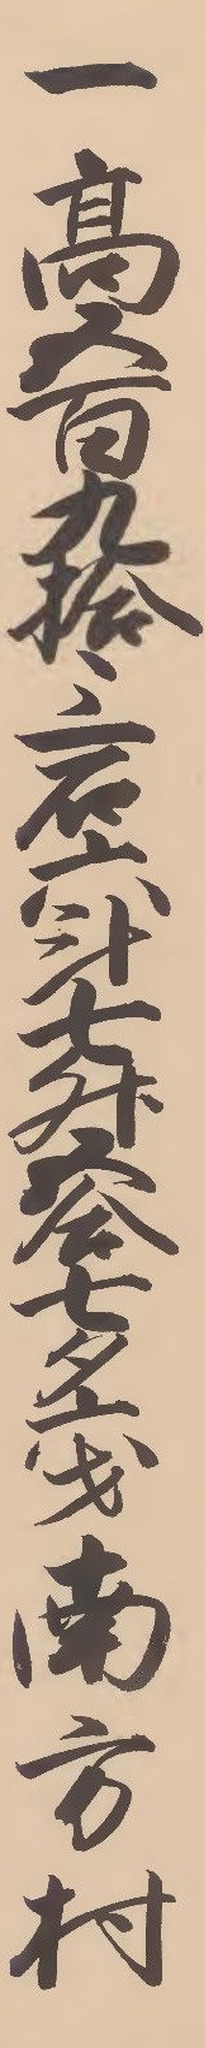一高五百九拾三石六斗七升五合七勺六才南方村

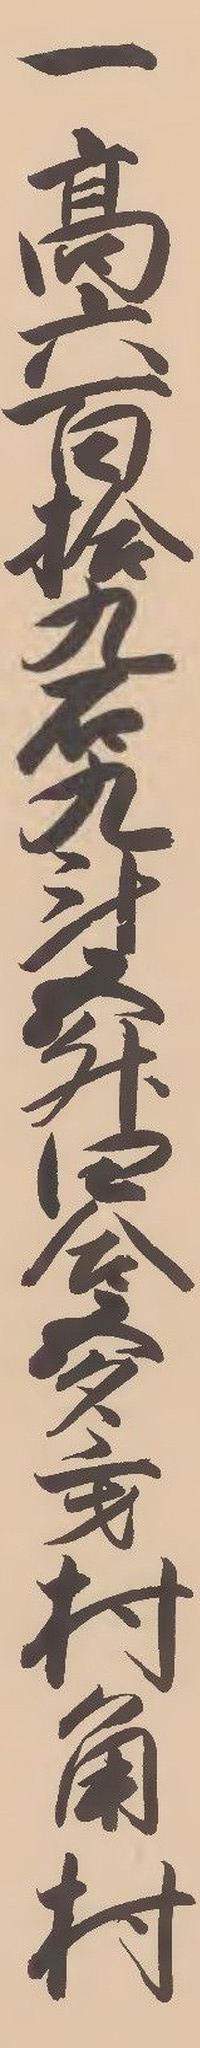一高六百拾九石九斗五升四合五勺三才村角村
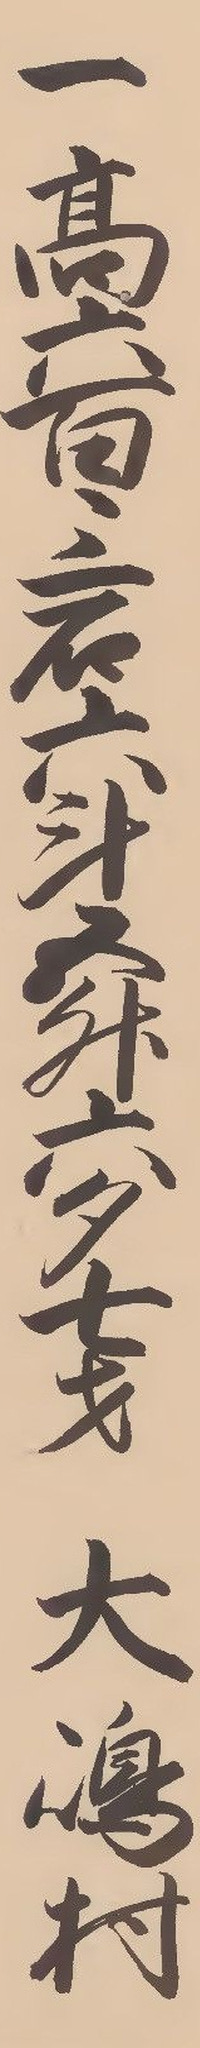一高六百三石六斗五升六勺七才大島村
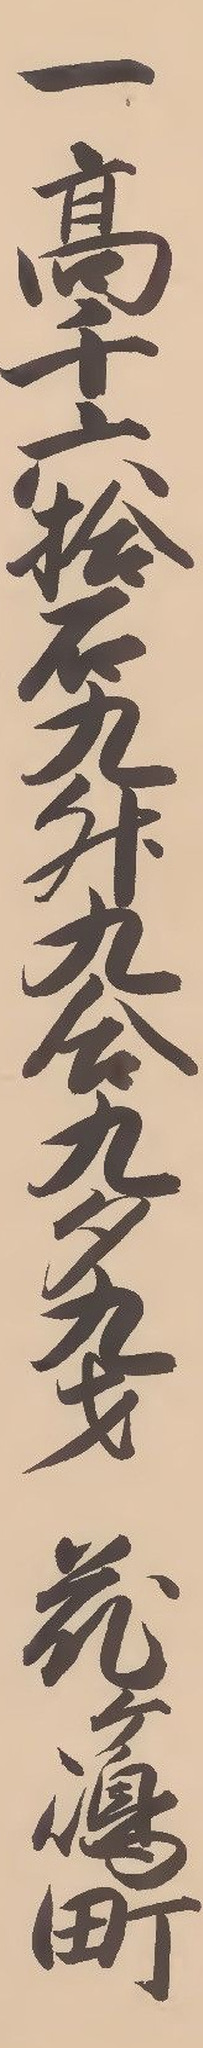一高千六拾石九升九合九勺九才花ヶ島町
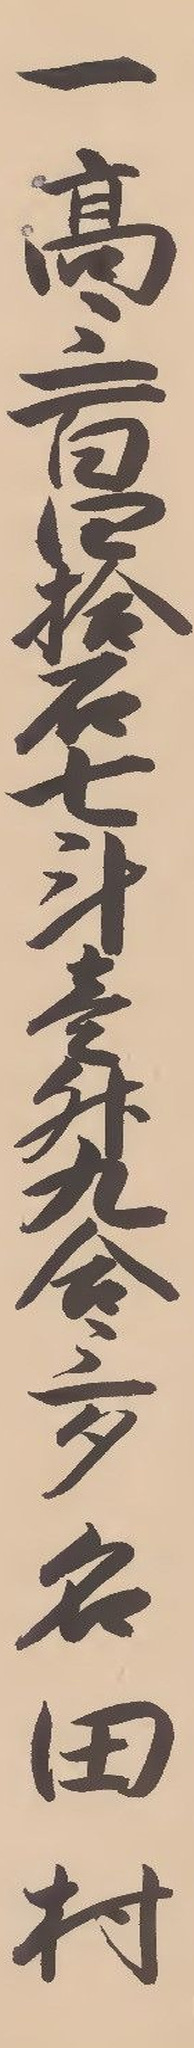一高三百四拾石七斗壱升九合三勺名田村
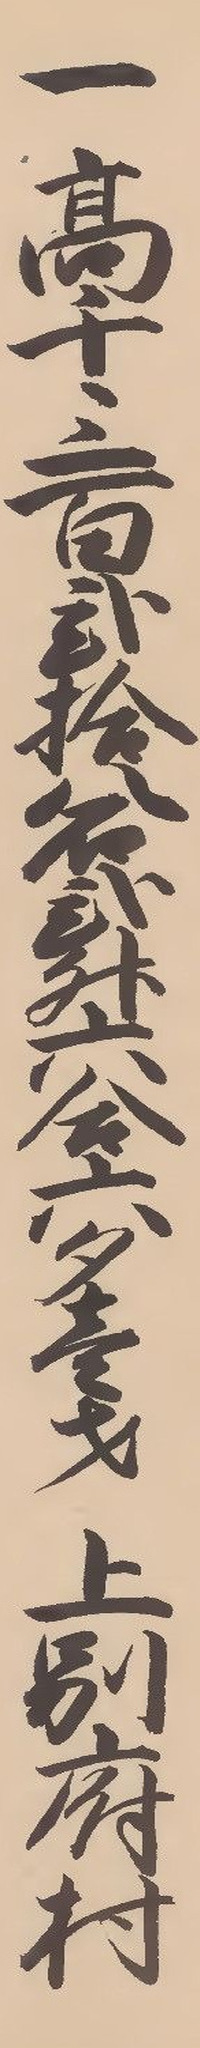一高千三百弐拾八石弐升六合六勺壱才上別府村
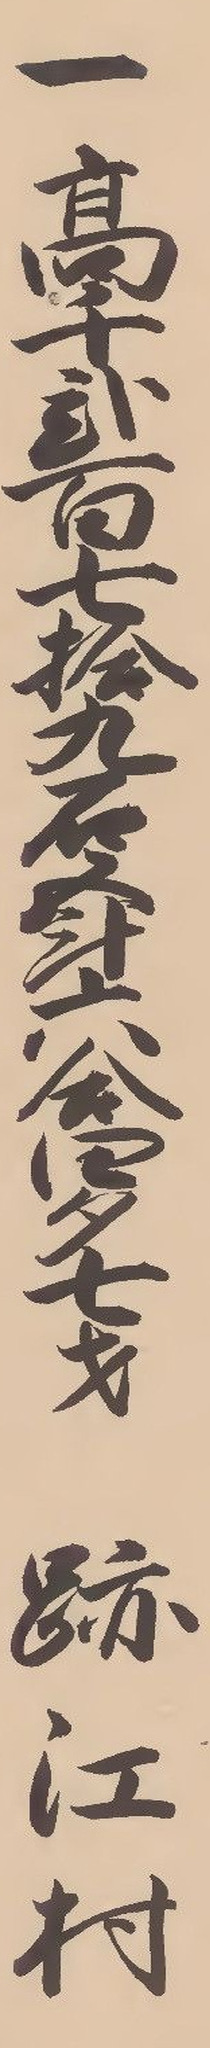一高千弐百七拾九石五斗六合四勺七才跡江村
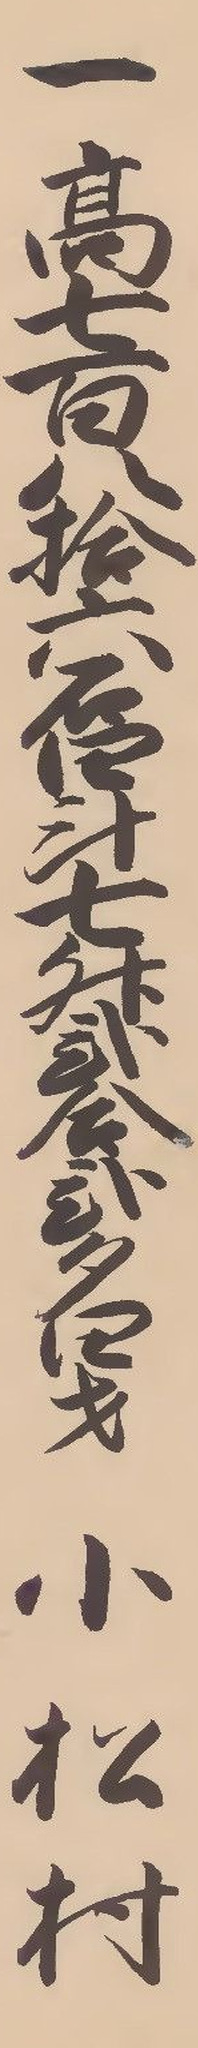一高七百八拾六石四斗七升弐合弐勺四才小松村

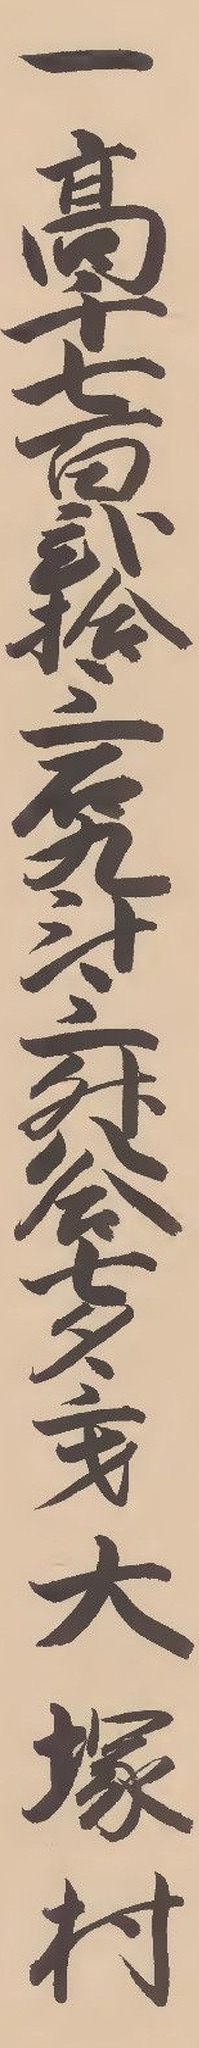一高千七百弐拾三石九斗三升八合七勺三才大塚村
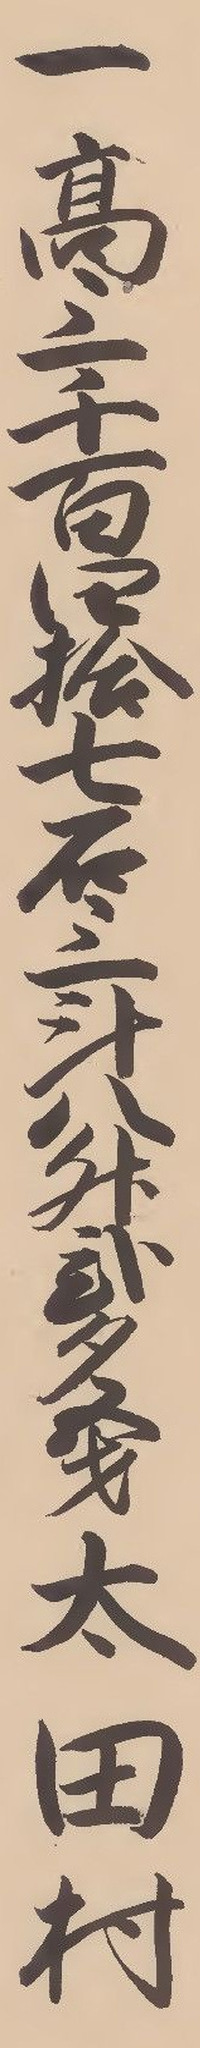一高三千百四拾七石三斗八升弐勺五才太田村
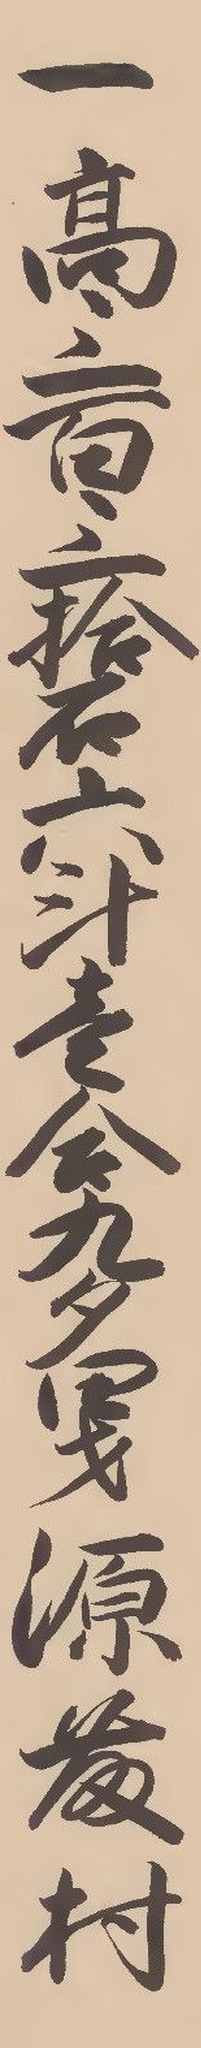一高三百三拾石六斗壱合九勺四才源藤村
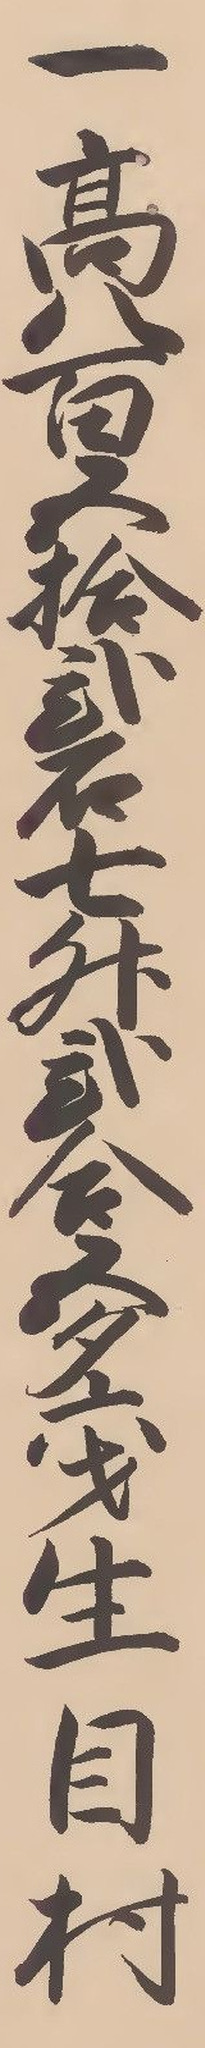一高八百五拾弐石七升弐合五勺六才生目村
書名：日向国郷帳
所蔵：国立公文書館 National Archives of Japan
